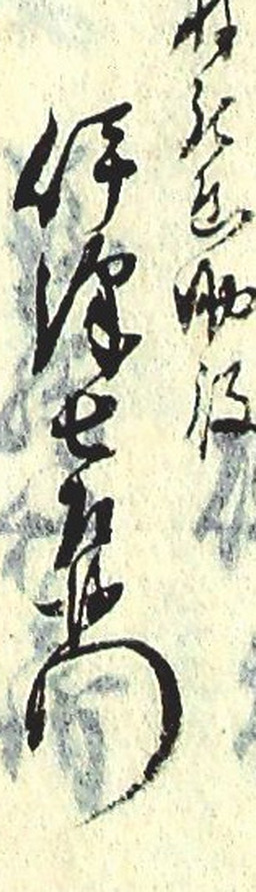伊沢七左衛門
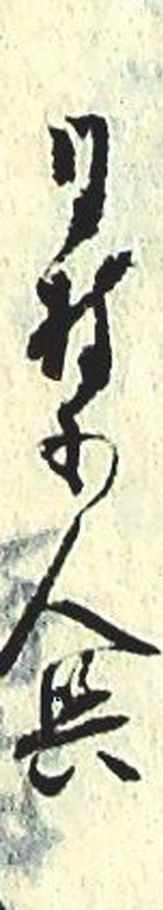同村五人与
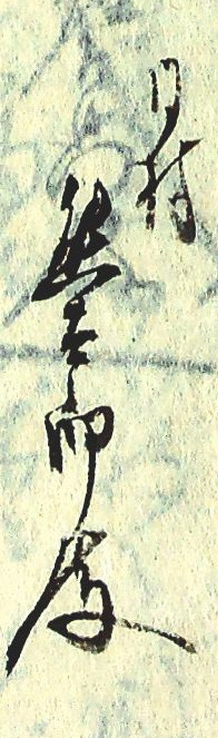熊太郎殿
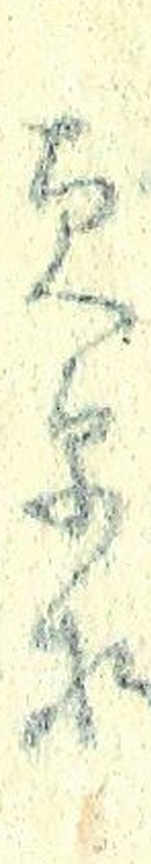貞兵衛

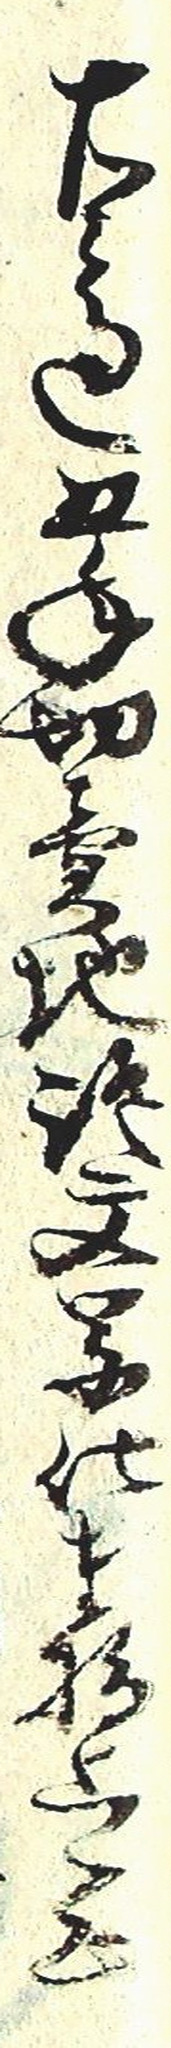右之通五年切売地証文写仕奉指上候以上
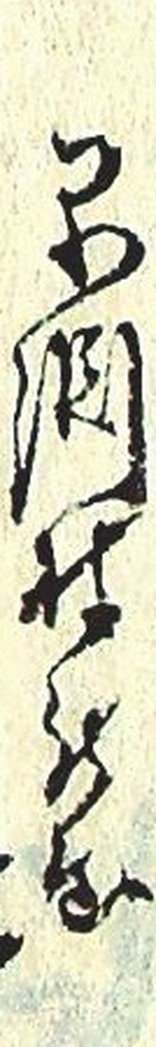早淵村庄屋
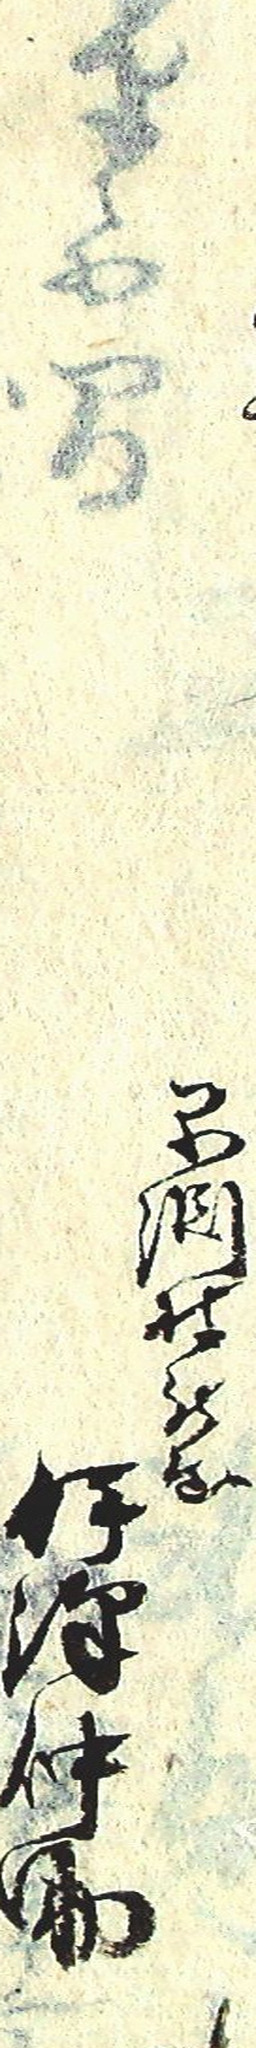伊沢仲助
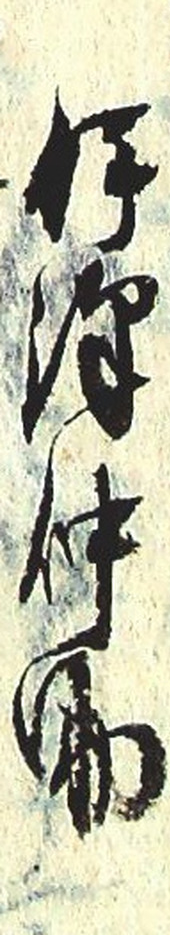伊沢仲助
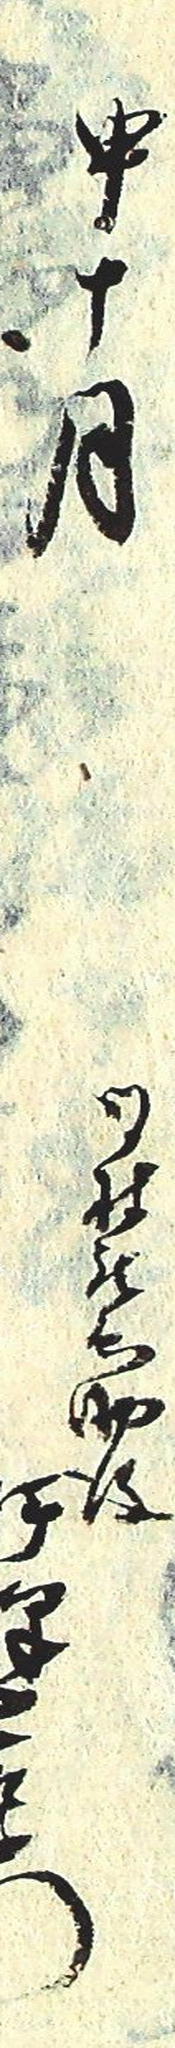申十月同村庄屋助役
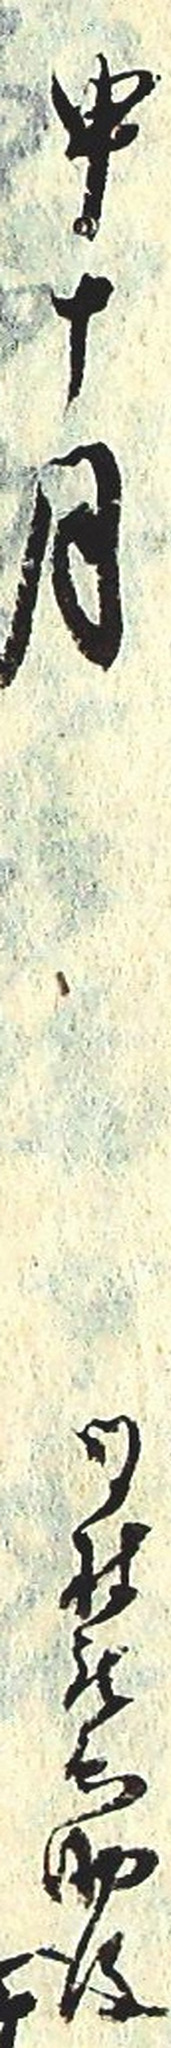申十月同村庄屋助役
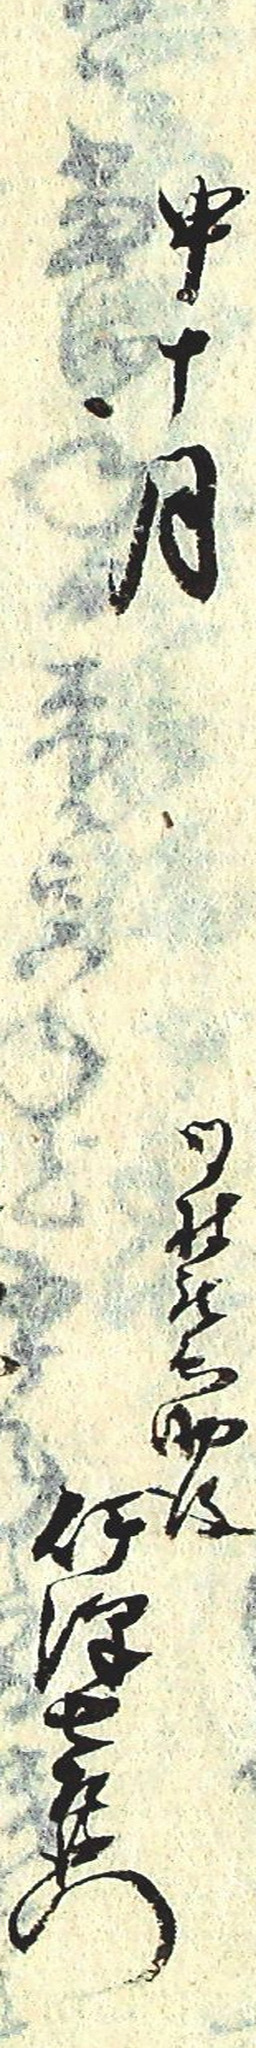伊沢七左衛門
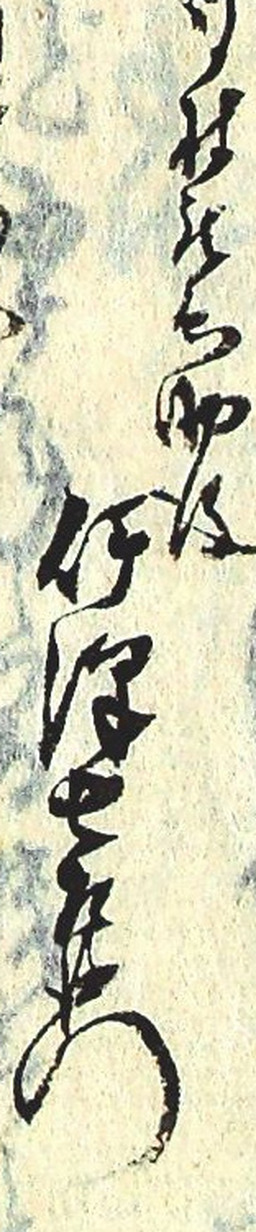伊沢七左衛門
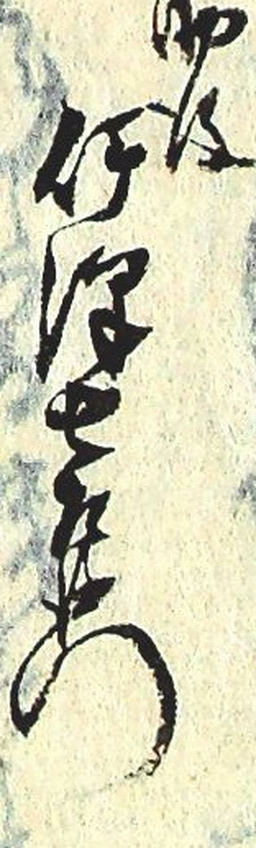伊沢七左衛門
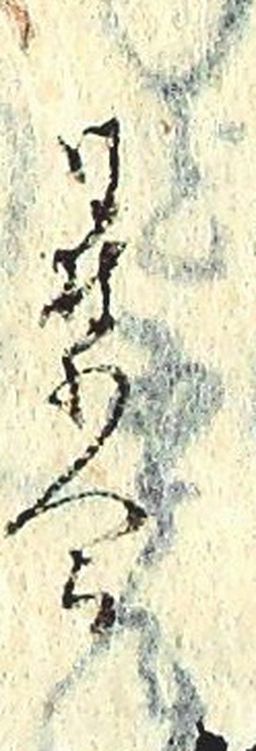同村五人与
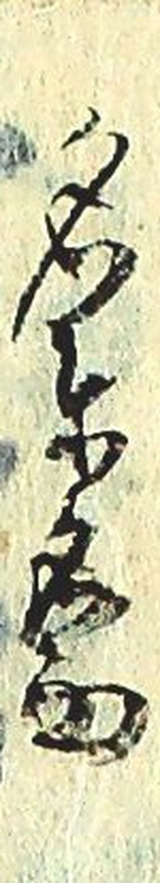名東名西
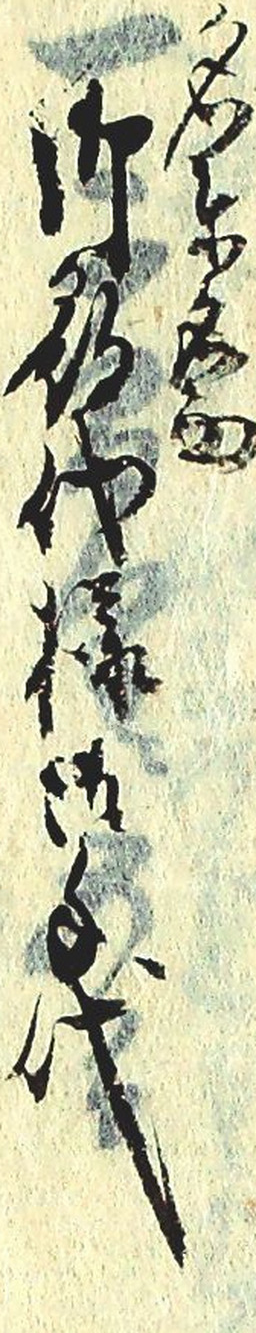御郡代様御手代
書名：諸御願書控(弐番）
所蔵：鳴門教育大学 Naruto University of Education
